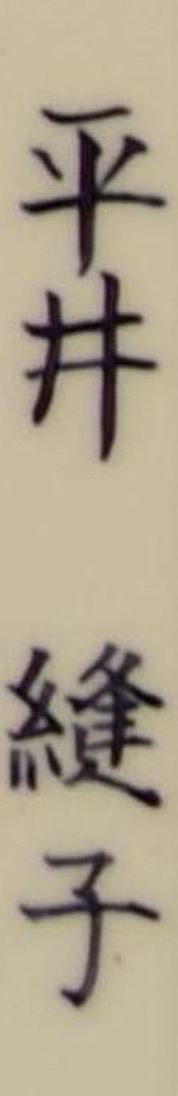平井縫子
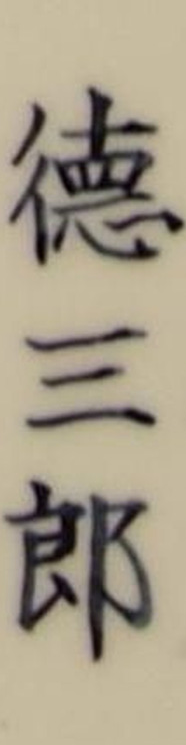徳三郎
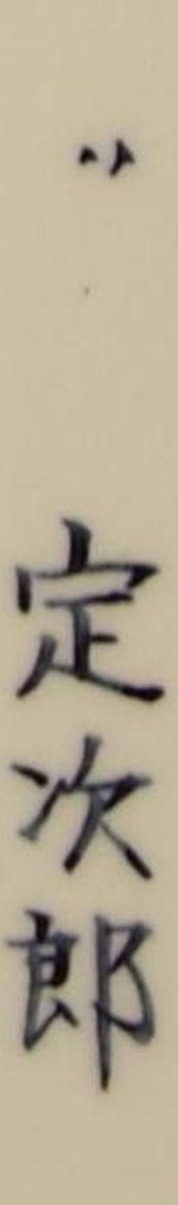定次郎
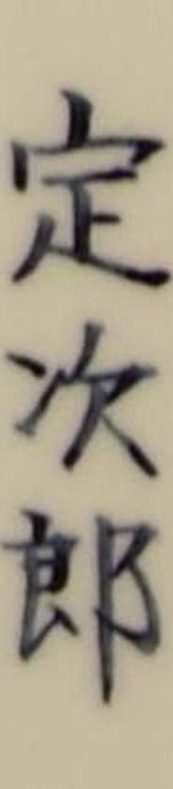定次郎
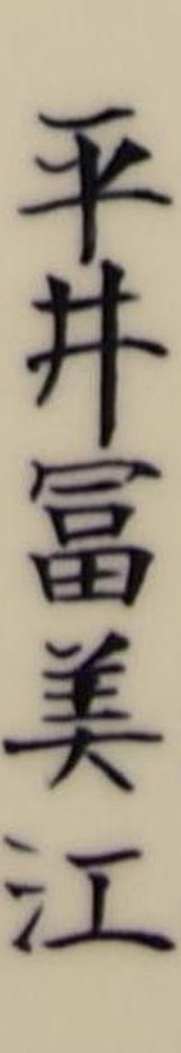平井冨美江
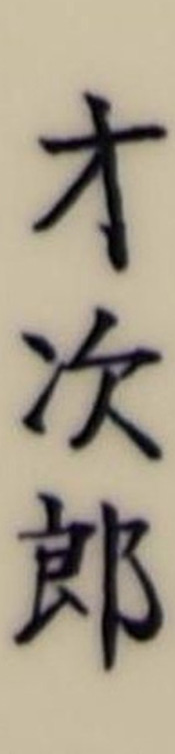才次郎
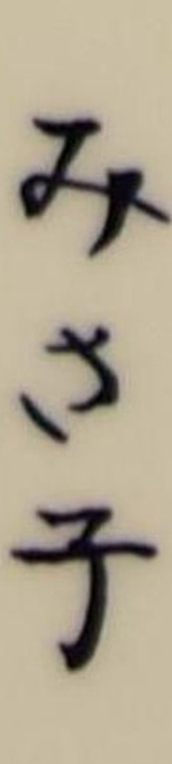みさ子
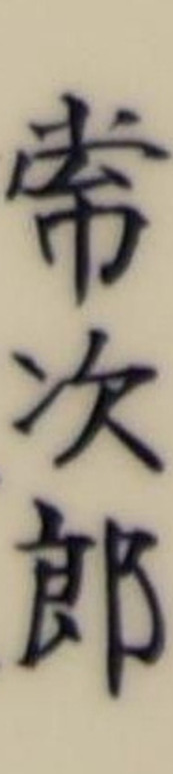常次郎
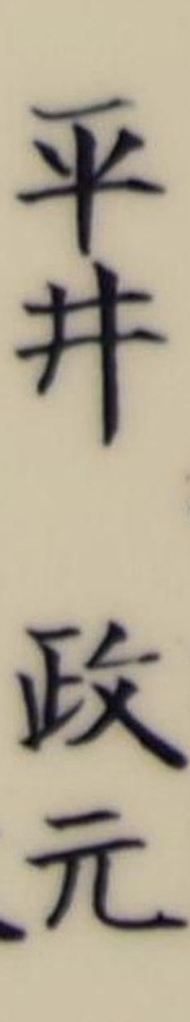平井政元
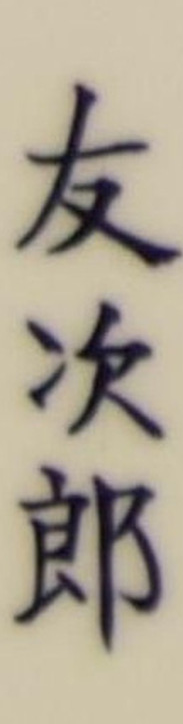友次郎

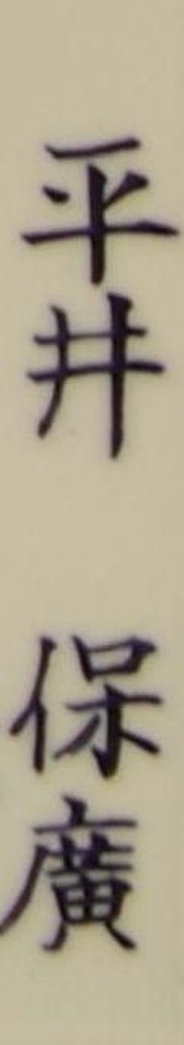平井保廣
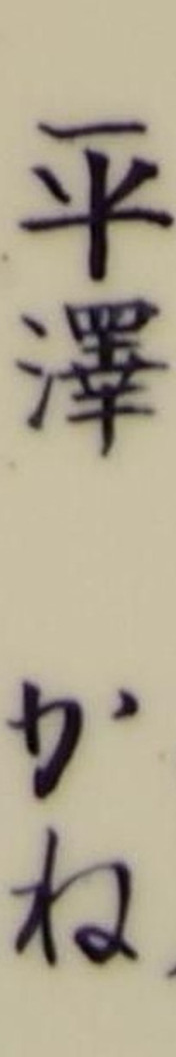平澤かね
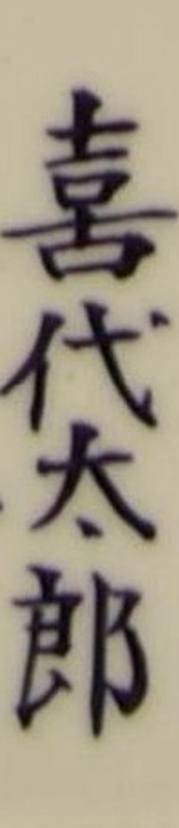喜代太郎

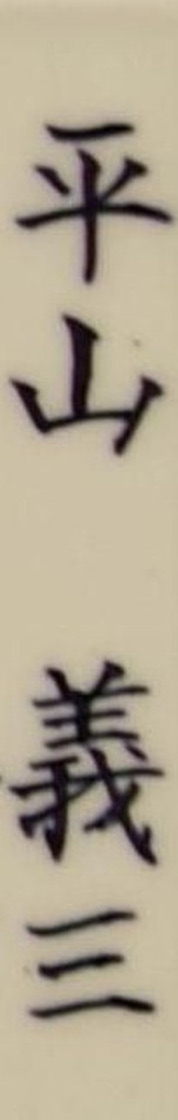平山義三
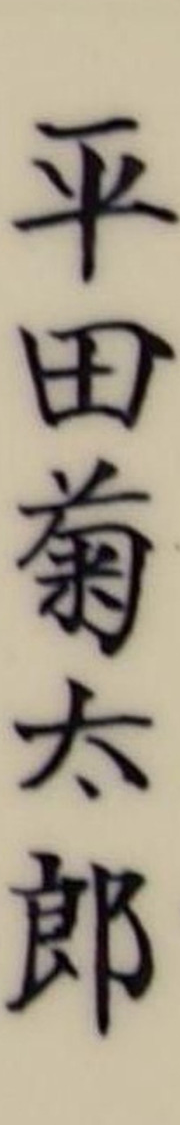平田菊太郎
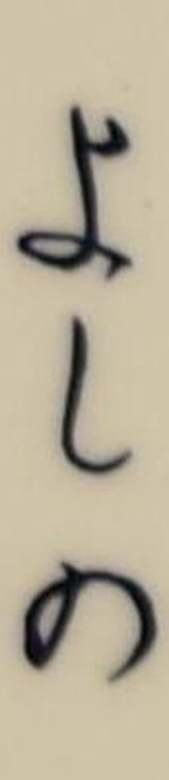よしの
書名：A~D
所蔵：koyasan kongobuji
